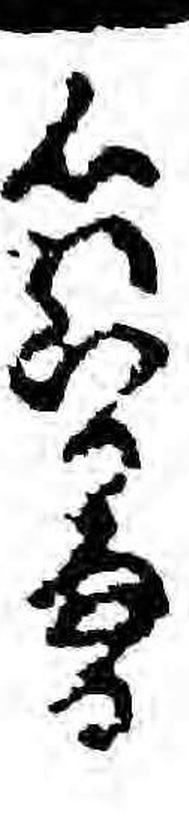心はいかなる
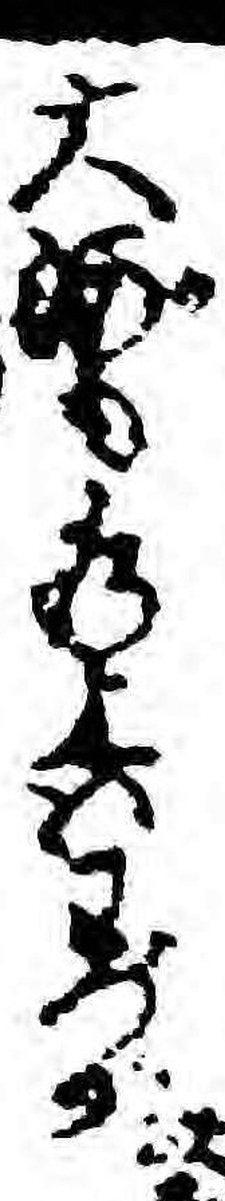大河も水上はわづが
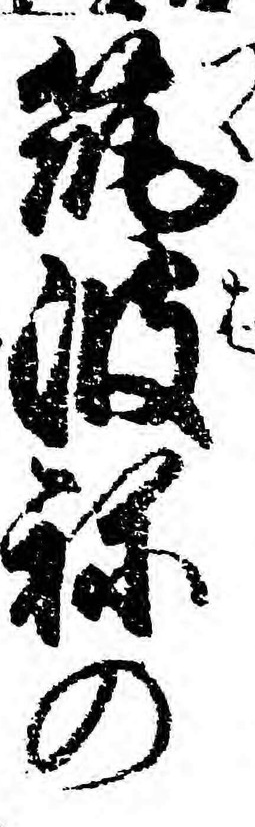筑波ねの
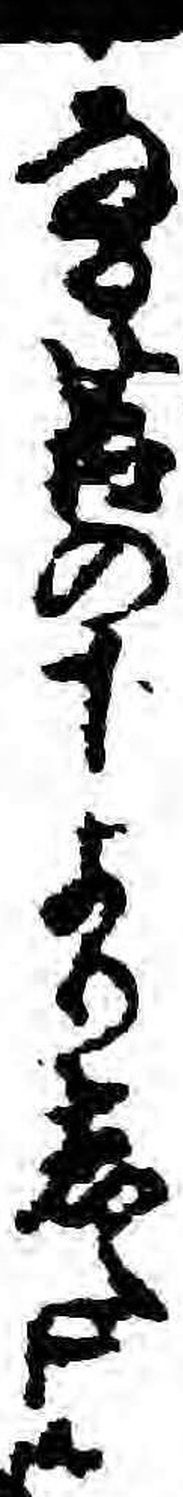なる苔の下よりした
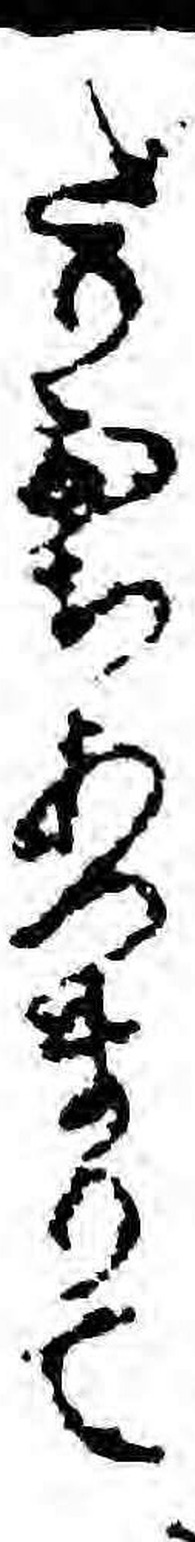だりおちあつまりて
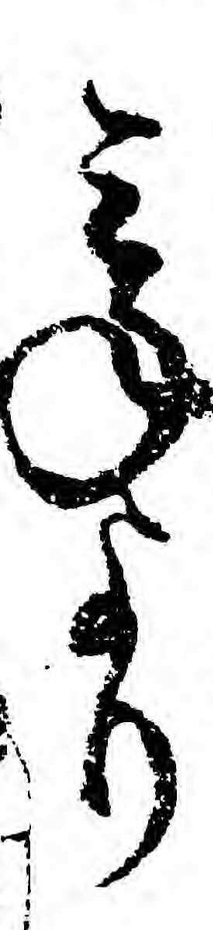みねより
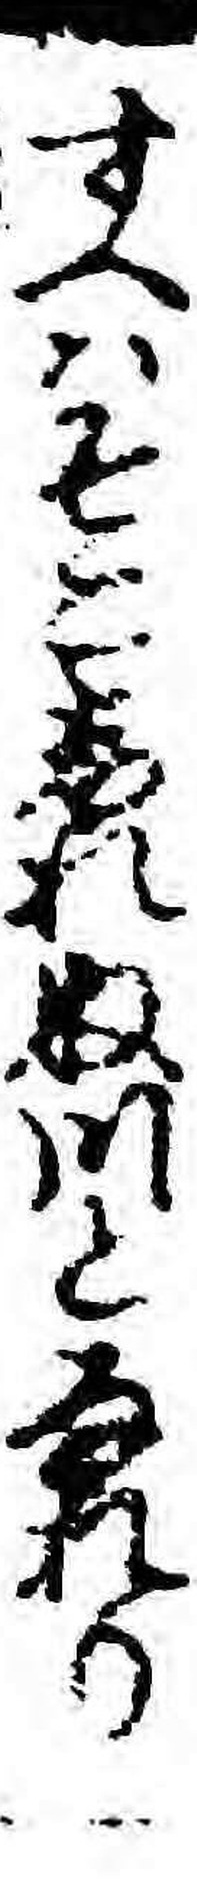すへはそこしれぬ川となれり
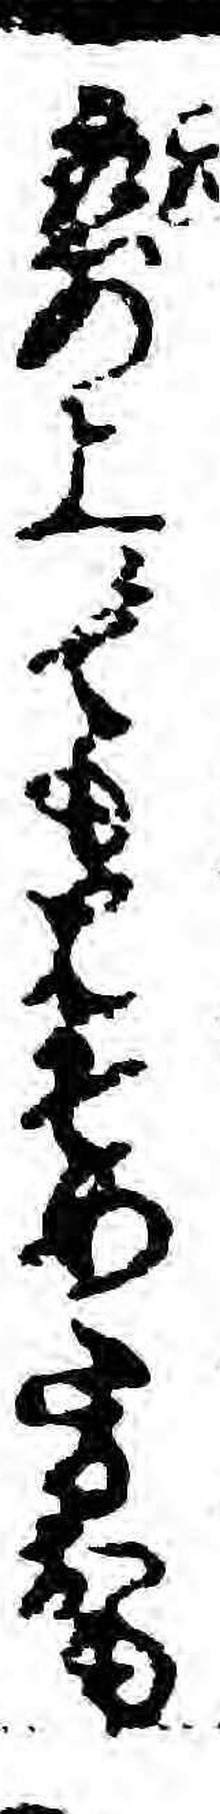恋の上にても見そめたるおも
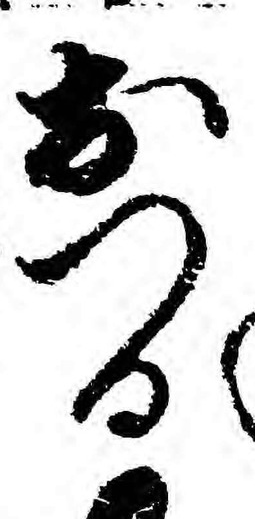おつる
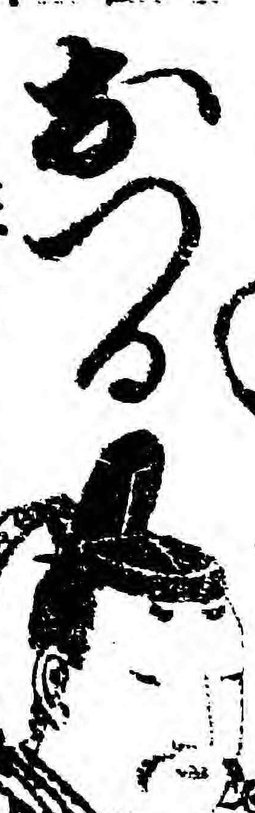おつる
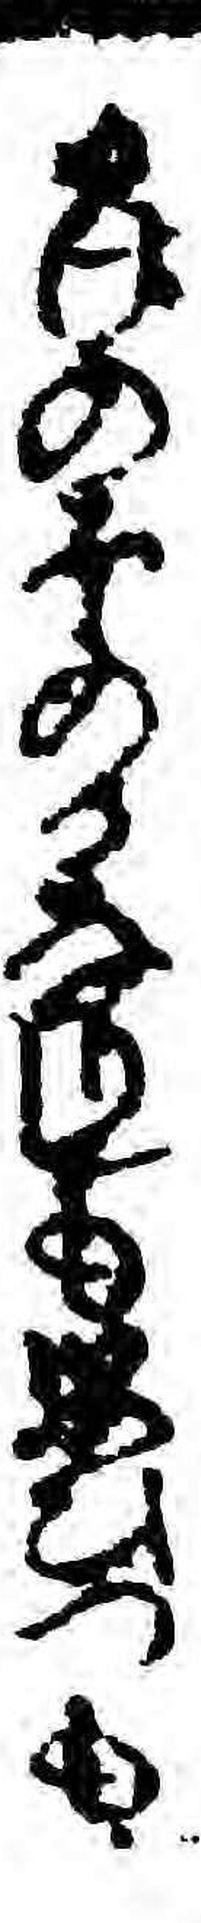かげのほのかなりしも思ひつも
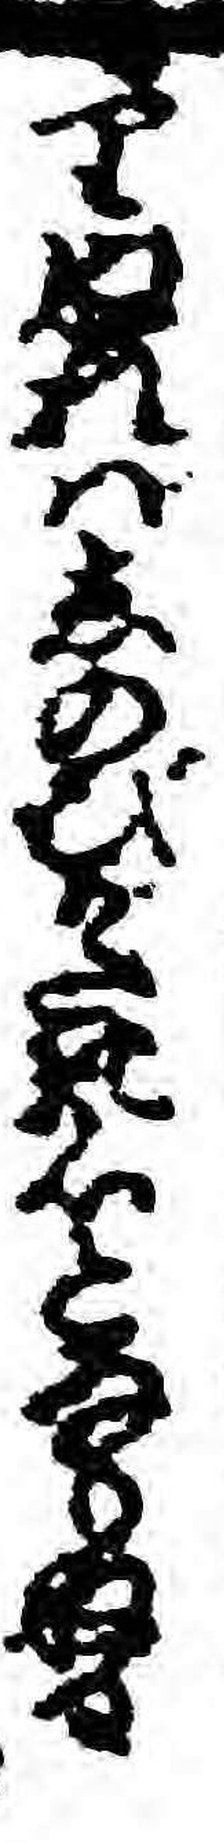りぬればしのびがたき心となりぬる
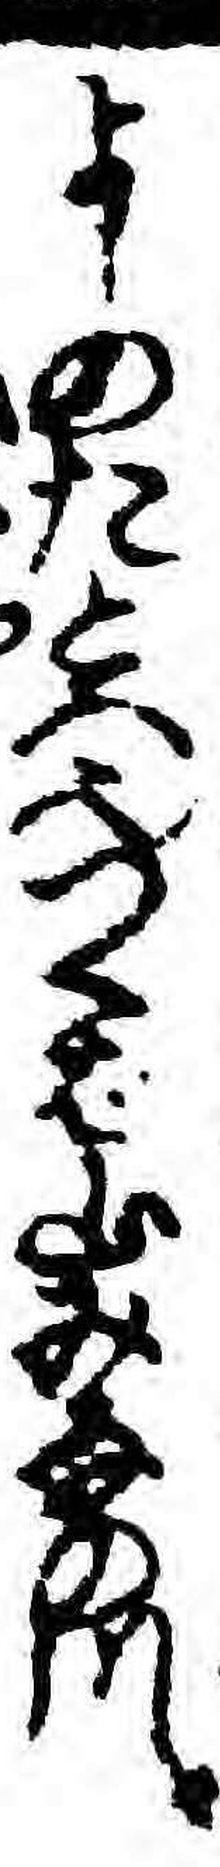よしのたとへ也つくば山みなの川
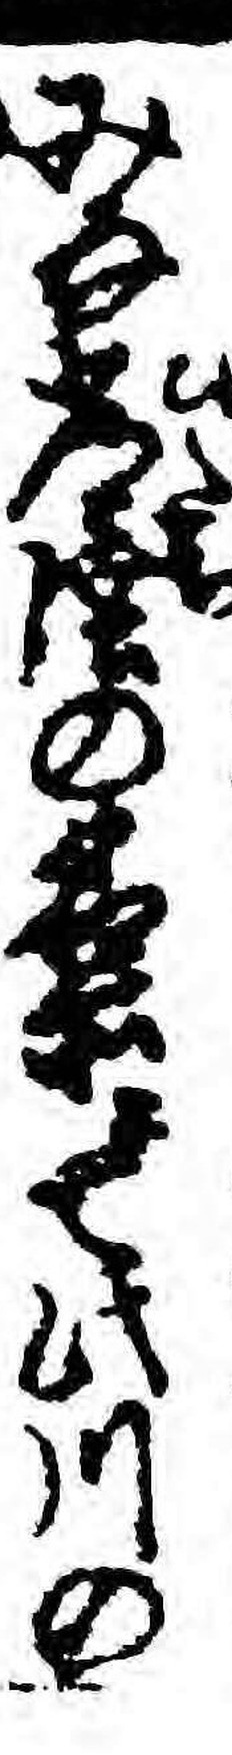みな常陸の名所にて此川の
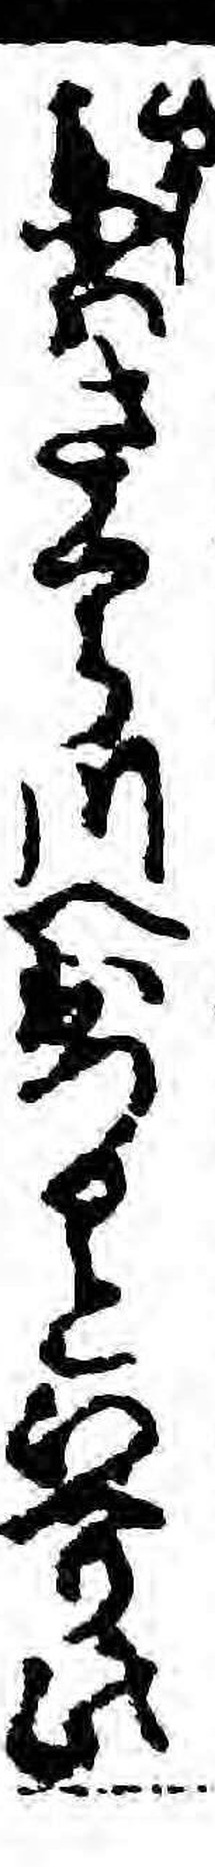東はさくら川へおつるといへり此
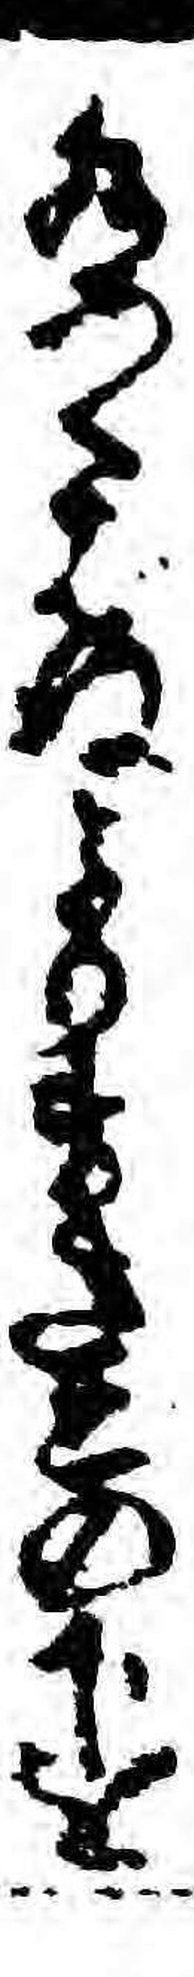水つくばねよりまさごの下を
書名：頭書和歌注譯／壽賀多百人一首小倉錦
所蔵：国文学研究資料館
